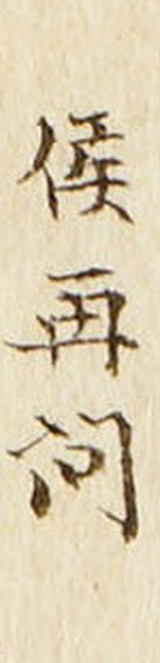候再問

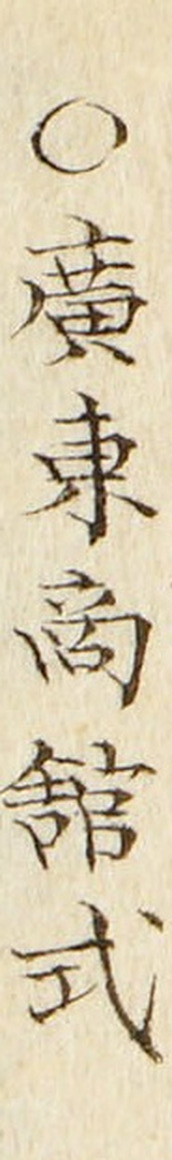〇広東商館式
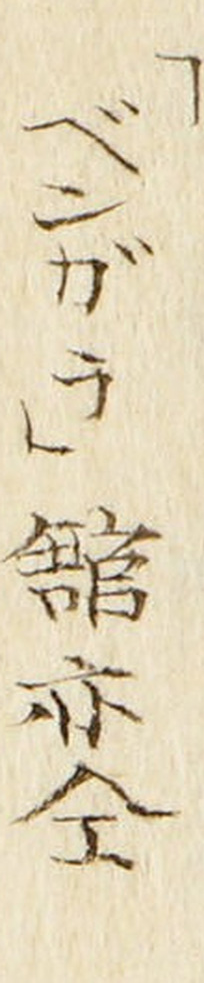「ベンガラ」館亦仝
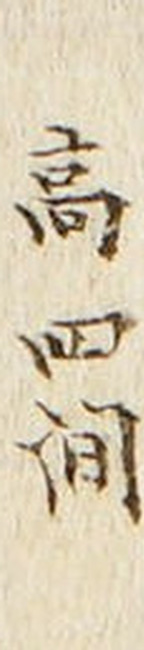高四間
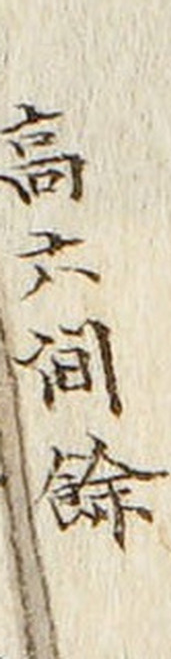高六間余
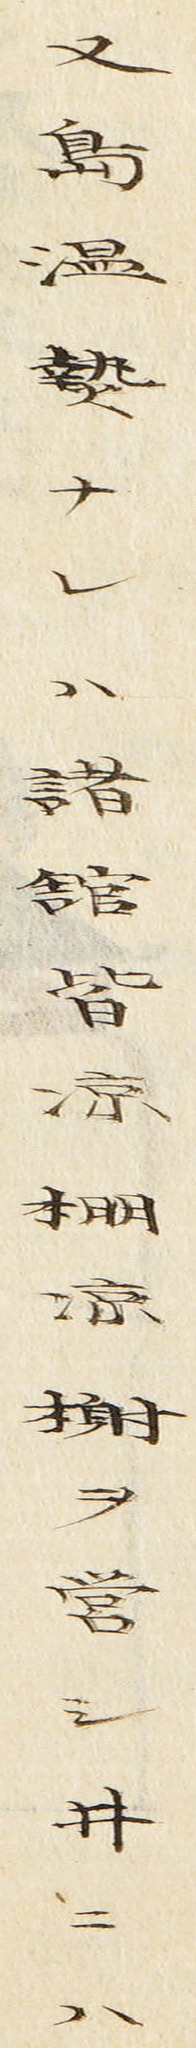〇又島温熱？ナレハ諸館皆涼棚涼榭ヲ営シ井ニハ
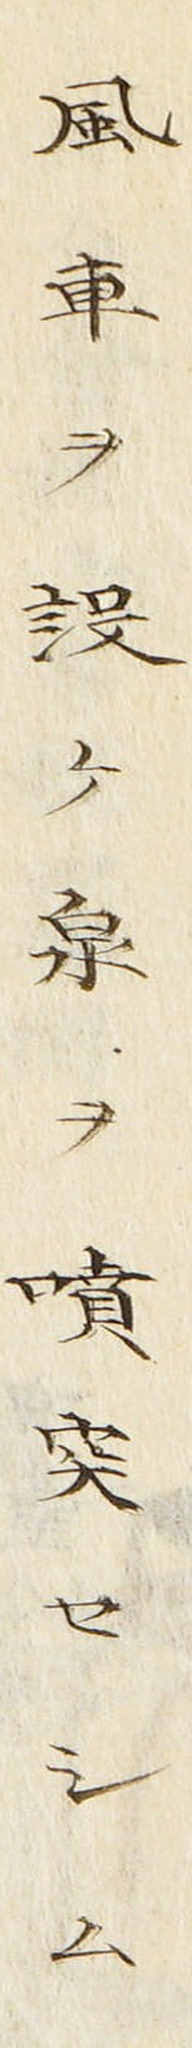風車ヲ設ケ泉ヲ噴突セシム
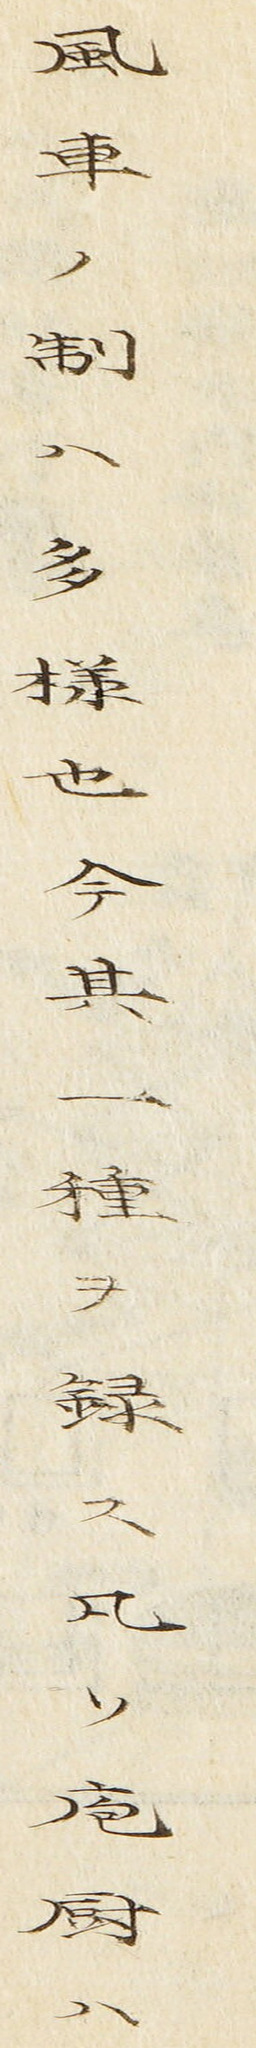〇風車ノ制ハ多様也今其一種ヲ録ス凡ソ庖厨ハ
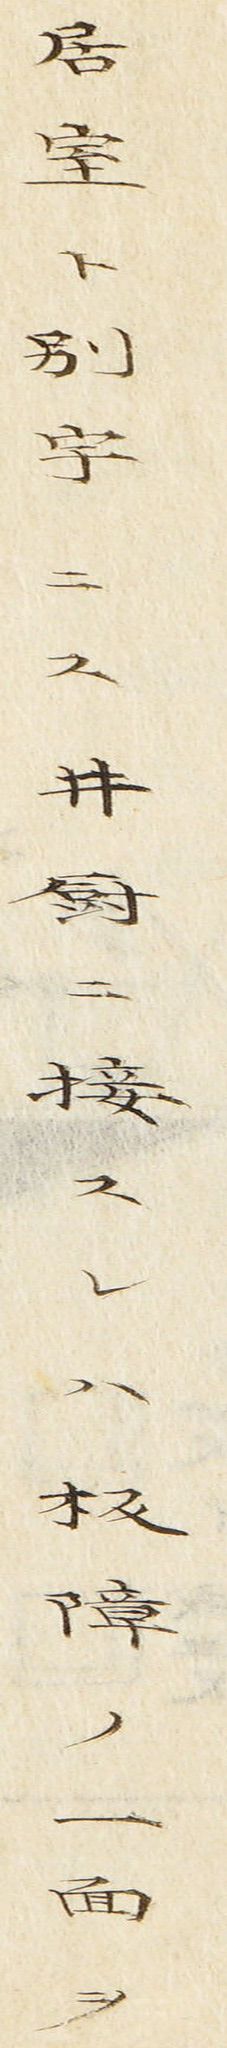居室ト別宇ニス井厨ニ接スレハ板障ノ一面ヲ
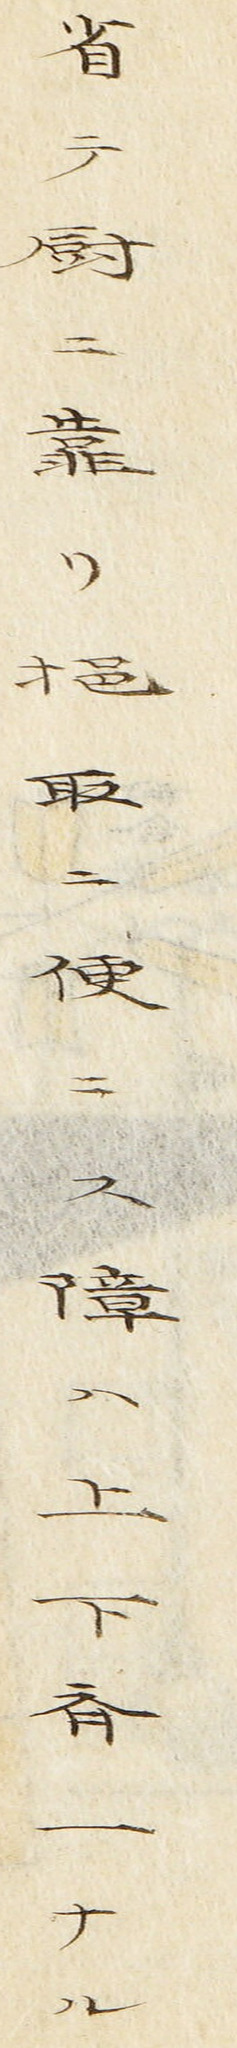省テ厨ニ靠リ挹取ニ便ニス障ハ上下斉一ナル
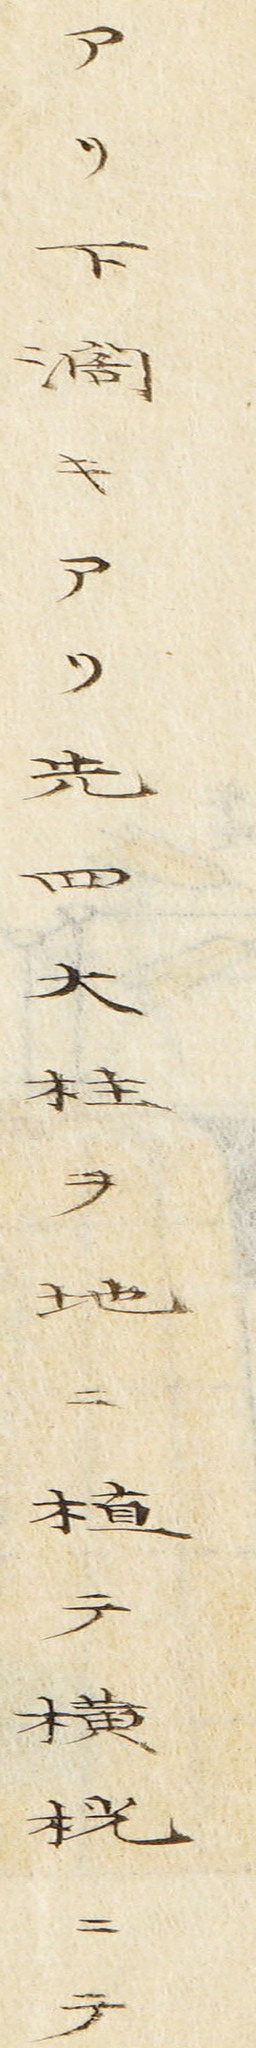アリ下濶キアリ先四大柱ヲ地ニ植テ横桄ニテ
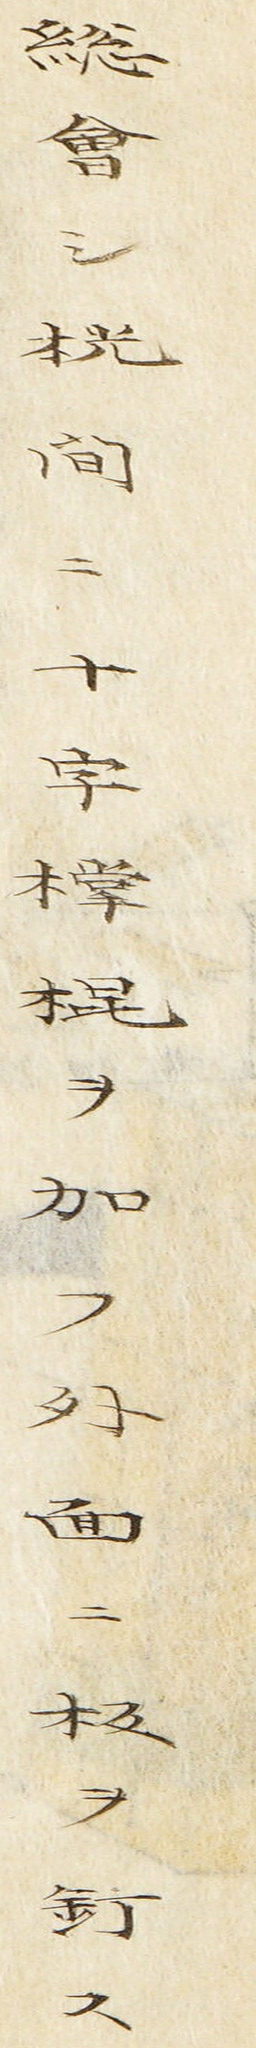総会シ桄間ニ十字棍ヲ加フ外面ニ板ヲ釘ス
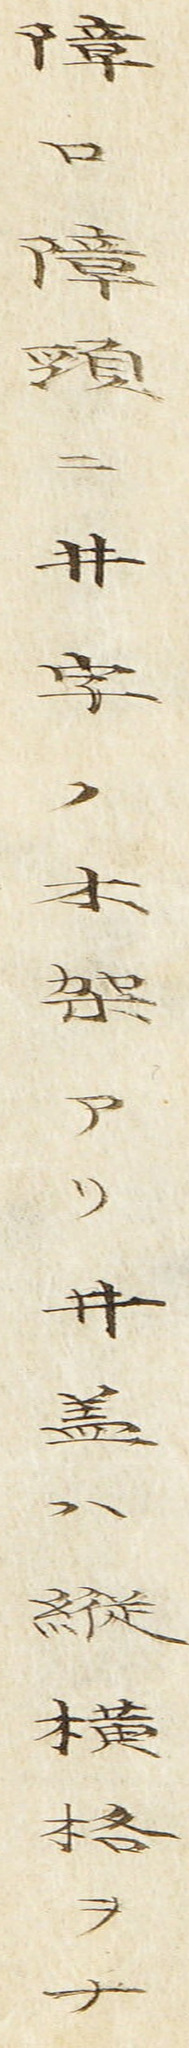障口障頸ニ井字ノ木架アリ井盖ハ縦横格ヲナ
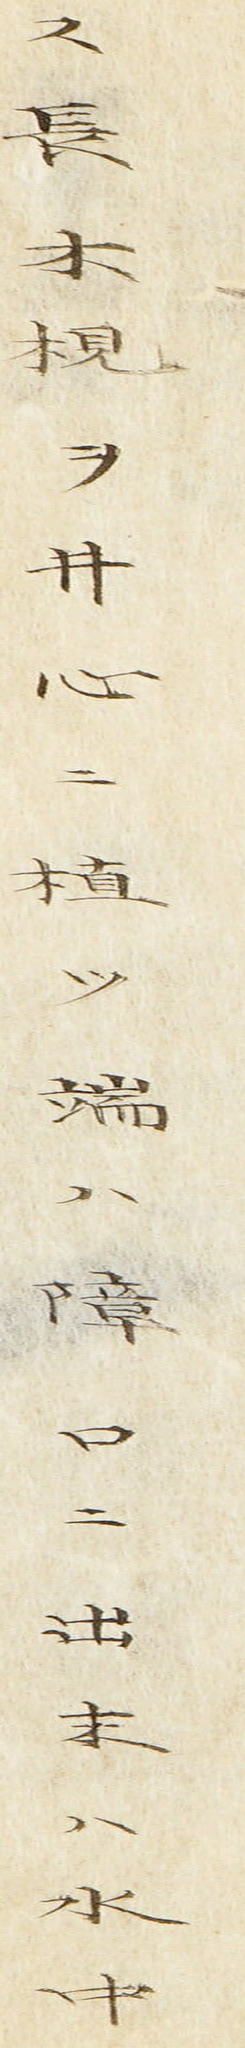ス長木梘ヲ井心ニ植ツ端ハ障口ニ出末ハ水中
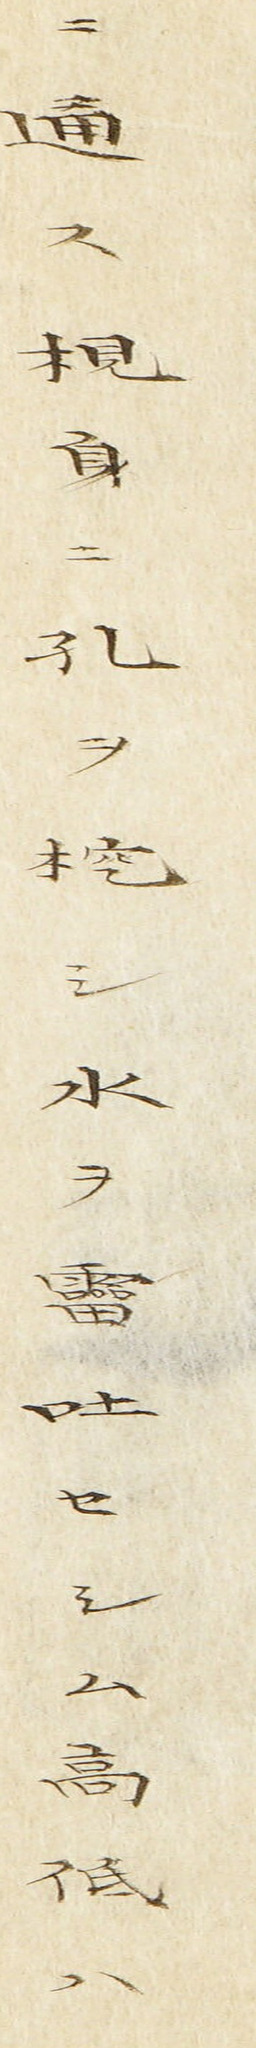ニ通ス梘身ニ孔ヲシ水ヲ霤？吐セシム高低ハ

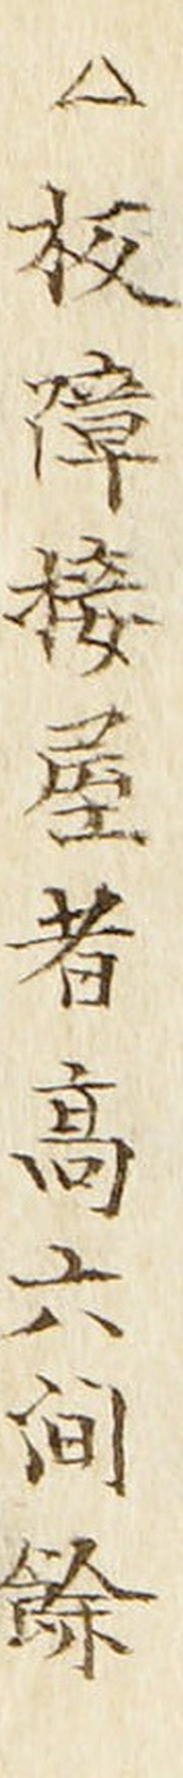△板障接屋者高六間余
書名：蕃談
